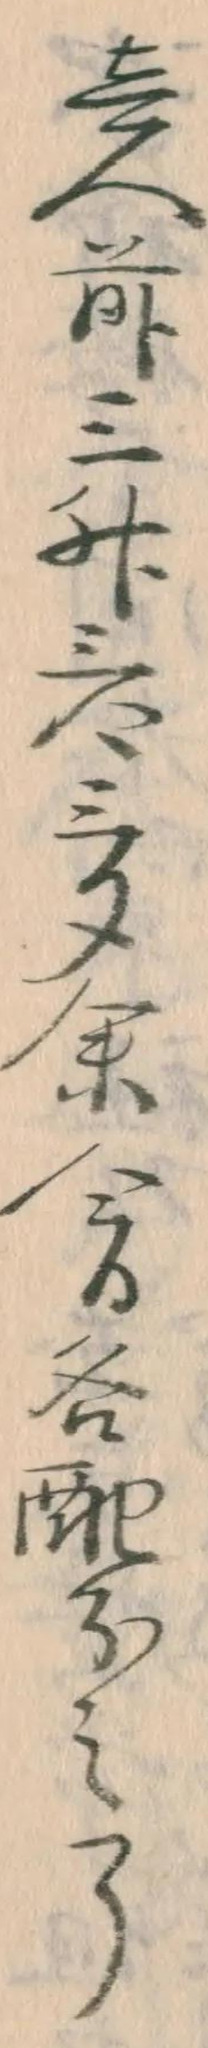壱人前三升三合三勺余今日各配分之了
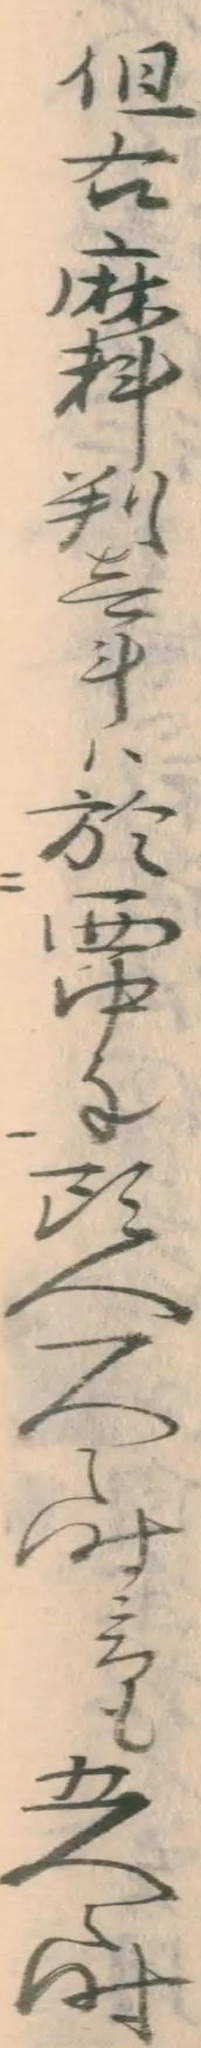但右麻料判壱斗ハ於西中手頭人一人之時ニ而も五人之時
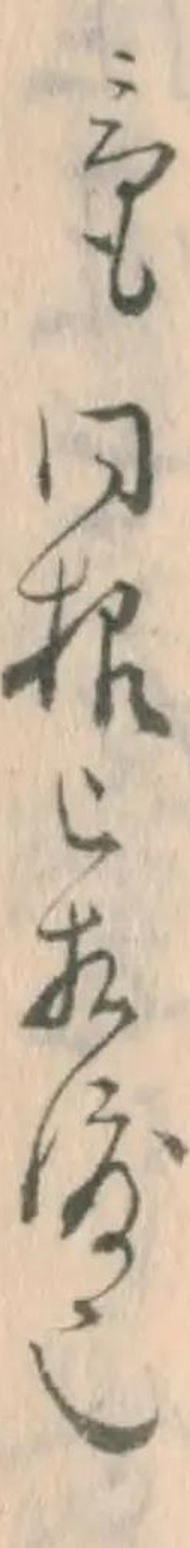ニ而も同被相渡也
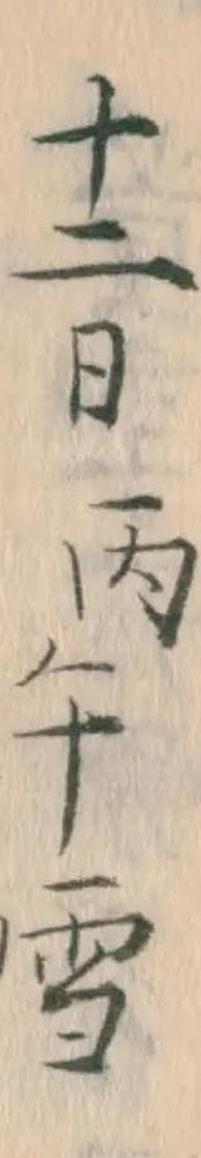十二日丙午雪
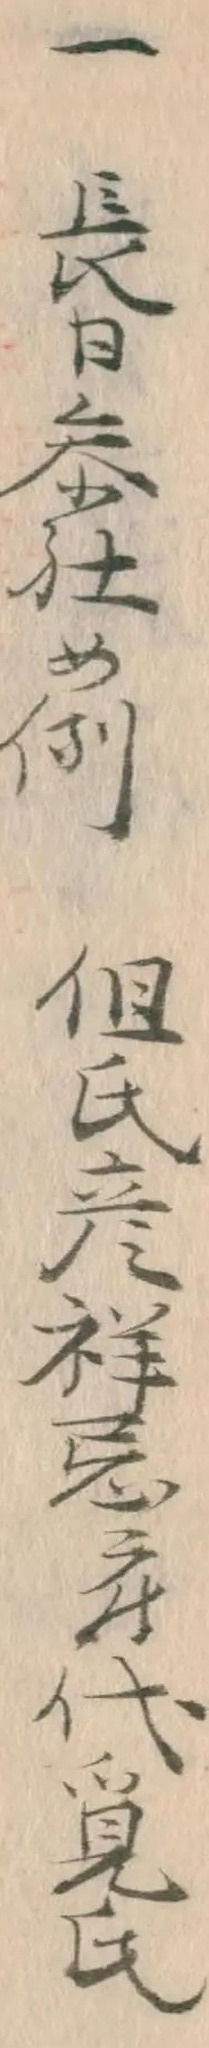一長日参社如例但氏彦祥忌ニ付代覓氏
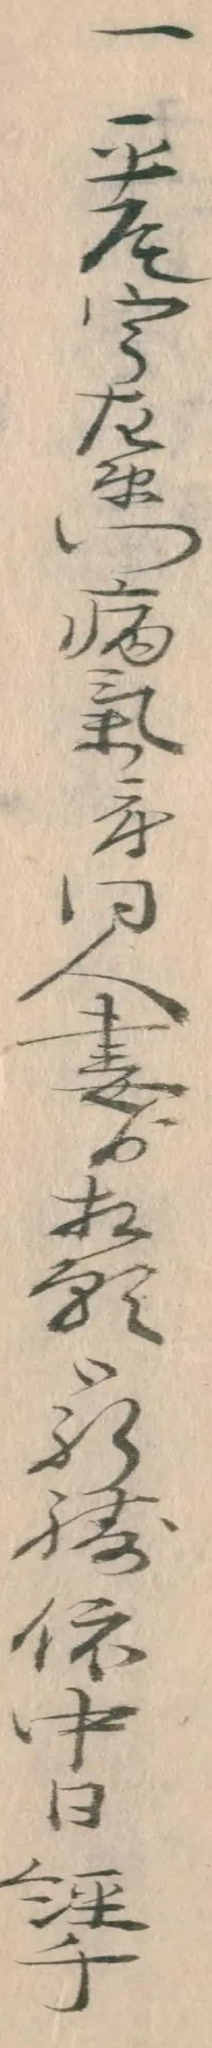一平尾宇左衛門病氣ニ付同人妻ゟ相願御祈祷依中日経千
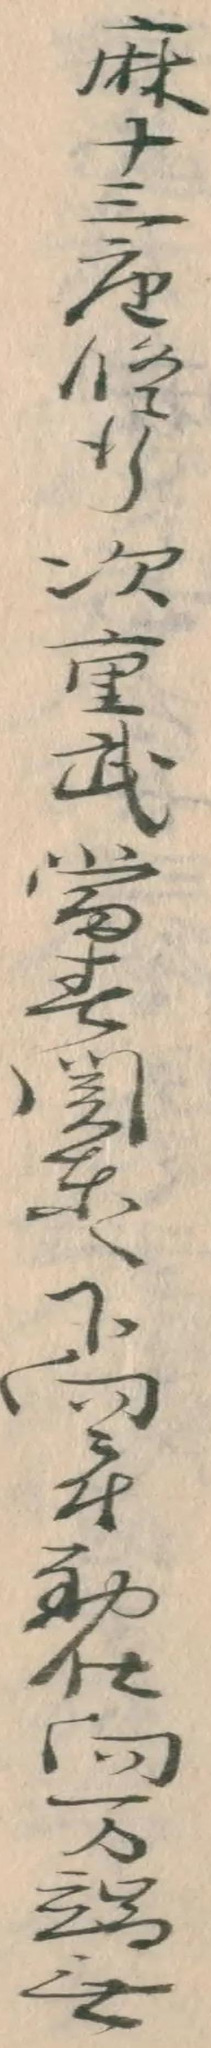麻十三座修行次重武當春関東へ下向ニ付勤仕向万端無
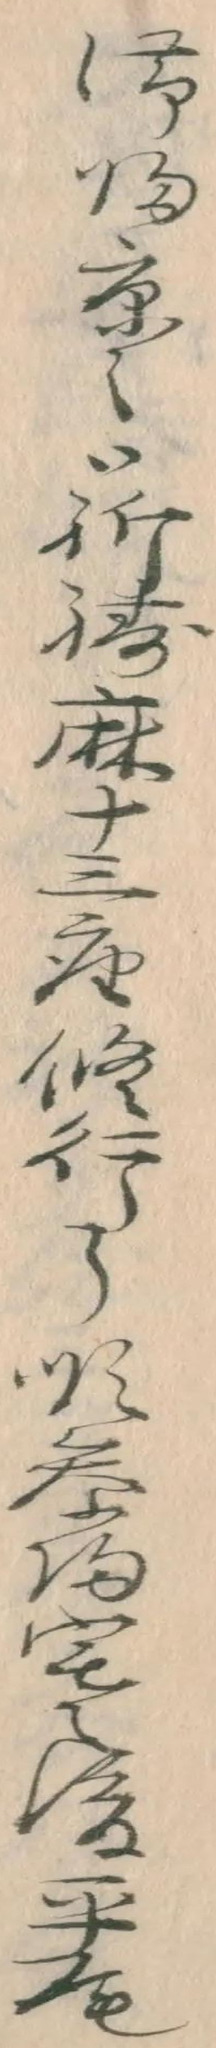滞帰京之御祈祷麻十三座修行了順参帰宅之後平尾
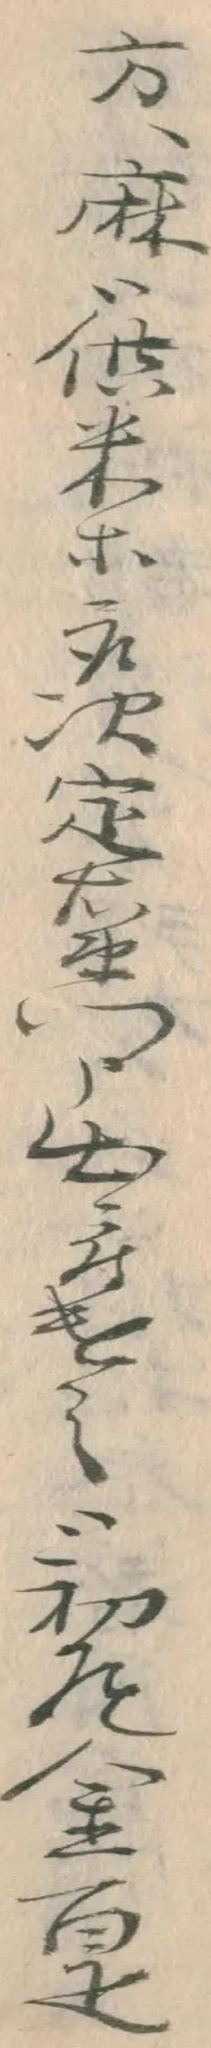方へ麻御供米等取次定右衛門申出ニ付遣之御初屋金百疋
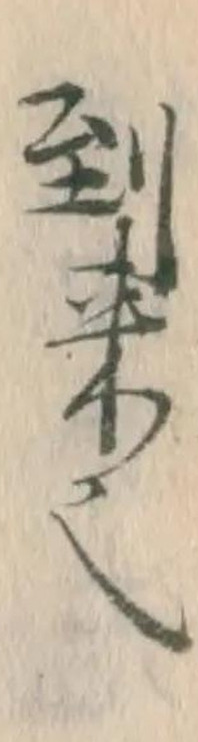到来也
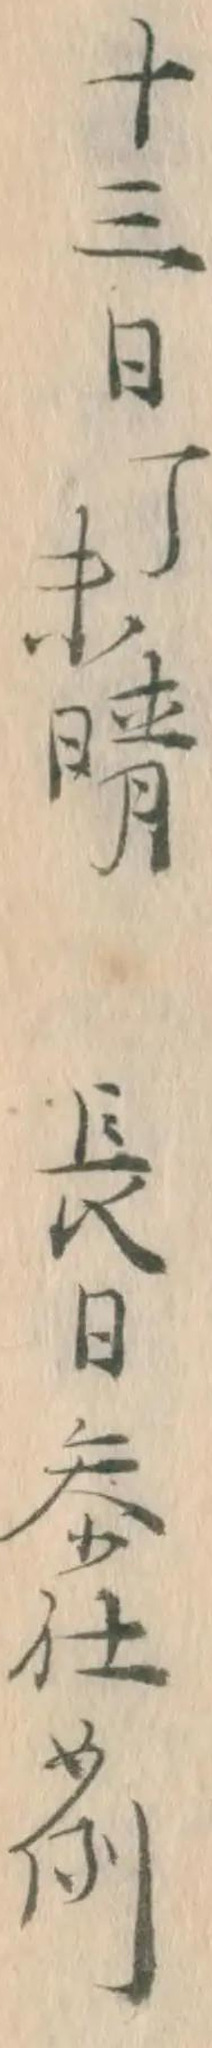十三日丁亥晴長日参社如例

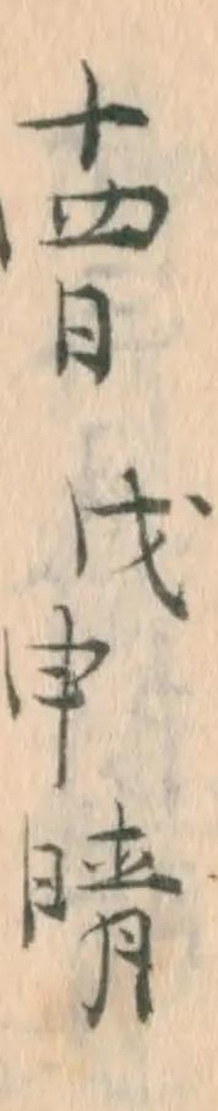十四日戊申晴
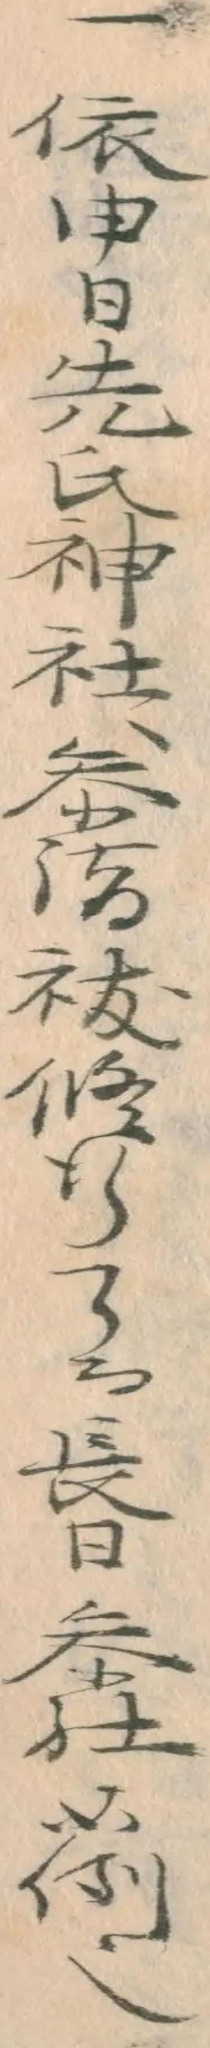一依申日先氏神社へ参詣祓修行了而長日参社如例也
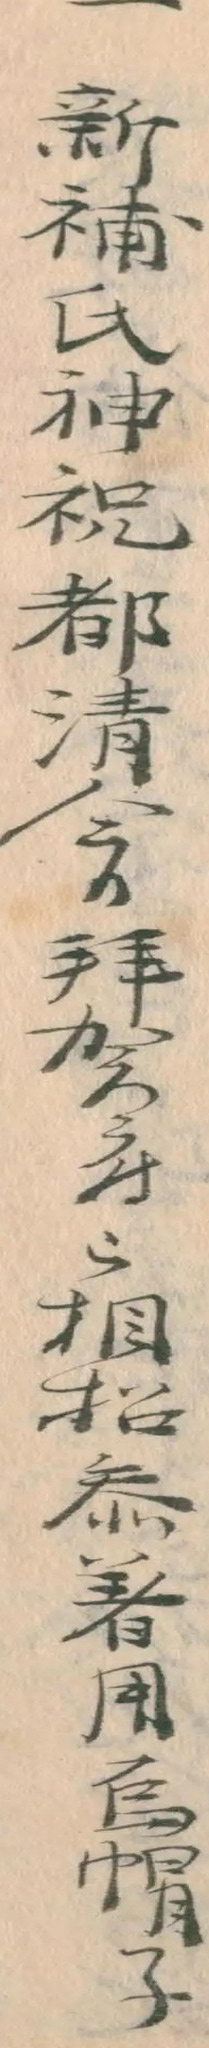一新補氏神祝都清今日拝賀ニ付被相招参着用烏帽子
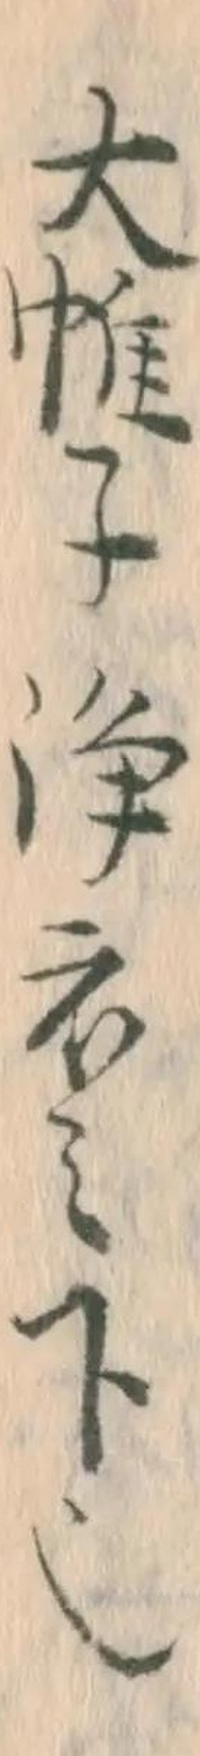大帷子浄衣之下也
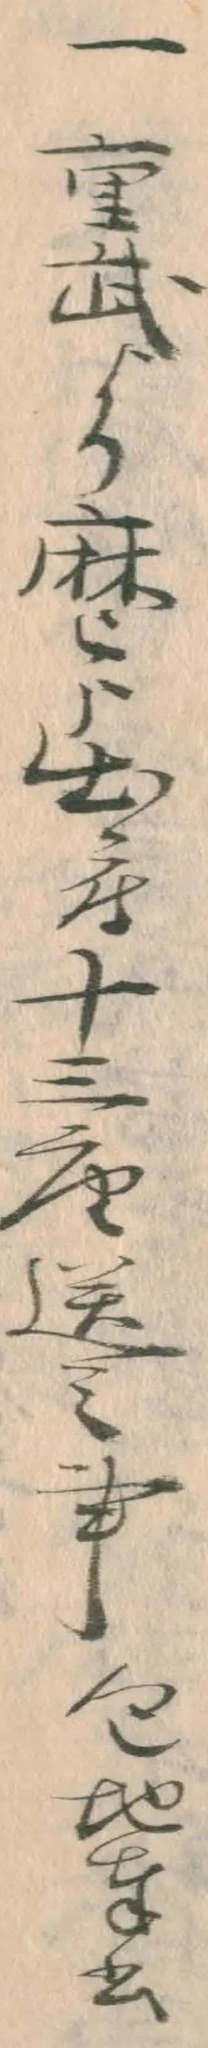一重武より麻被申出ニ付十三座送之事包地奉書
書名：賀茂社記録. 第72冊
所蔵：国立国会図書館 National Diet Library, JAPAN
